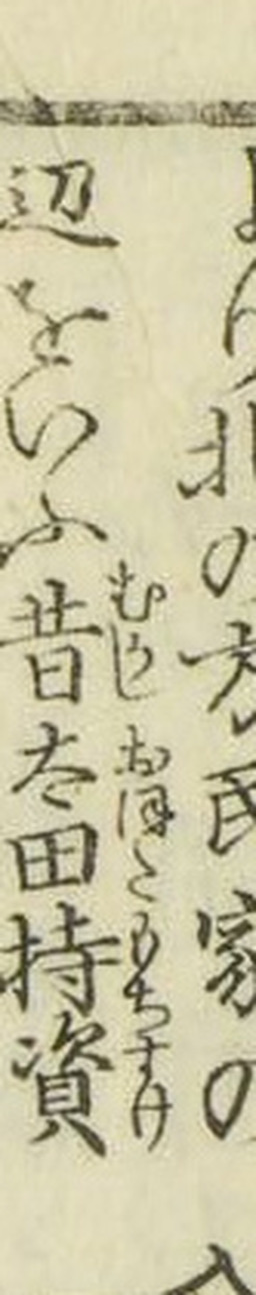辺をいふ昔太田持資
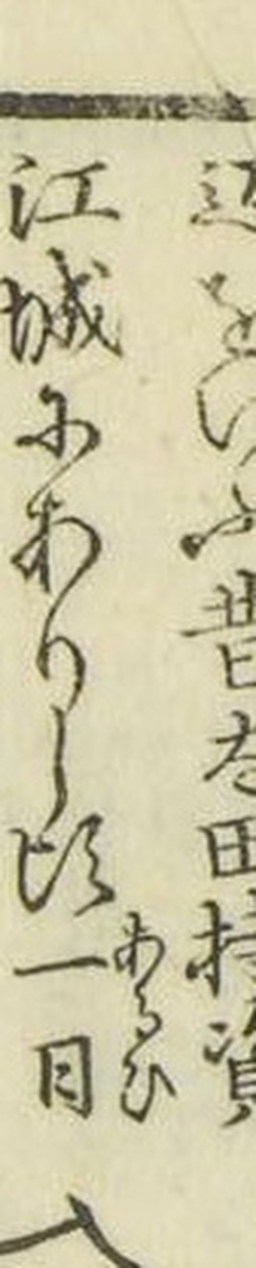江城にありし頃一日
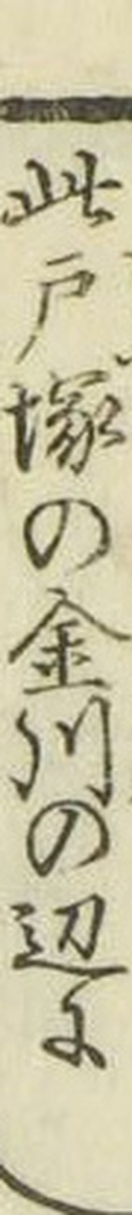此戸塚の金川の辺に
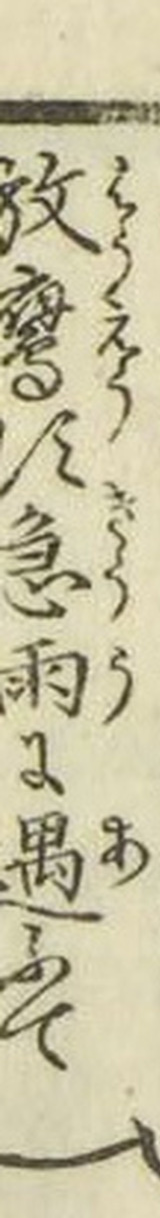放鷹す急雨に遭ふて
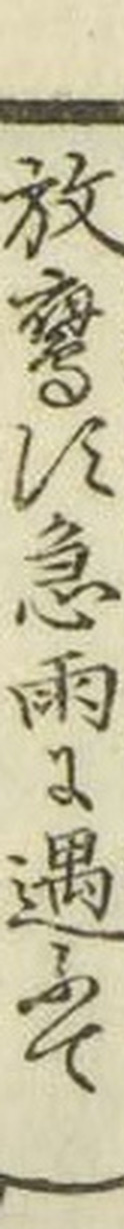放鷹す急雨に遭ふて
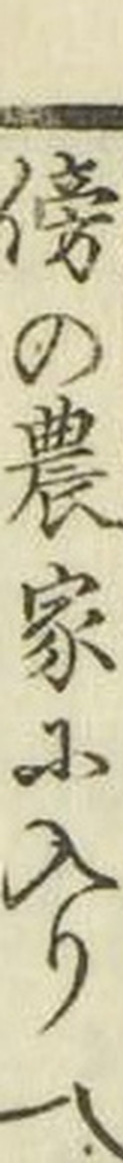傍の農家に入り
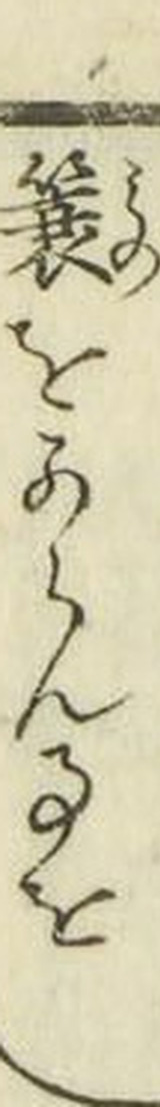簑をからん事を
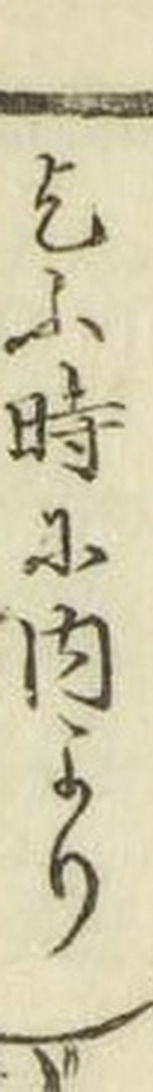乞ふ時に内より
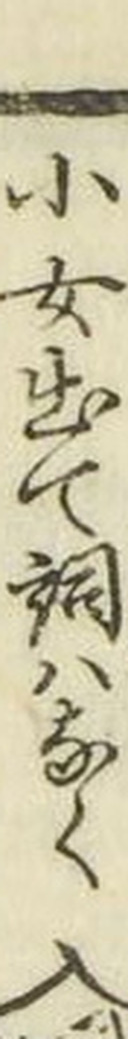小女出て詞はなく
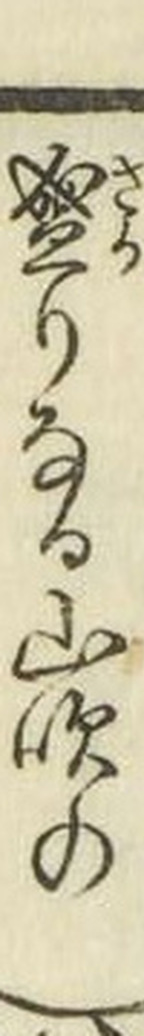盛りなる山吹の
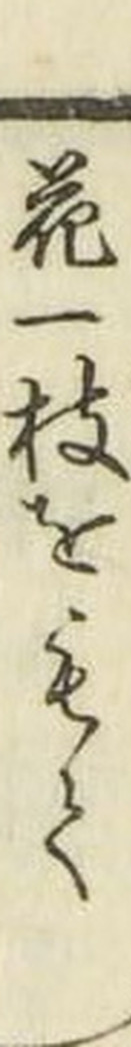花一枝をもて
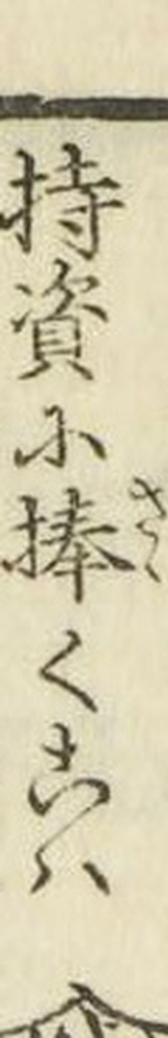持資に捧くこは
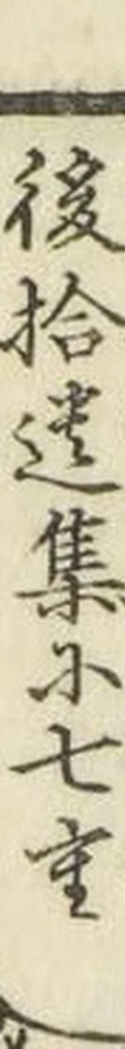後拾遺集に七重
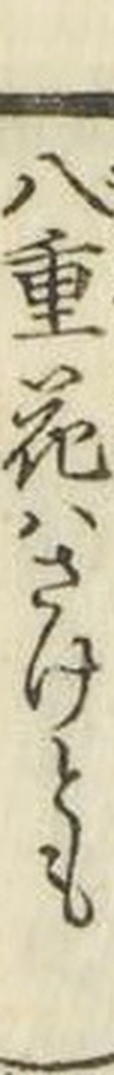八重花はさけとも
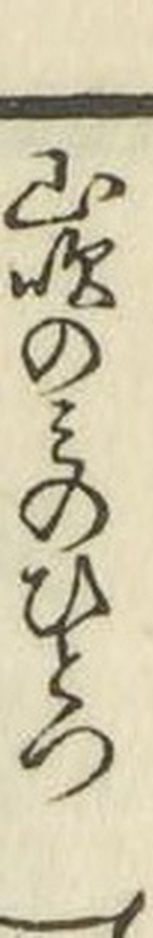山吹のみのひとつ
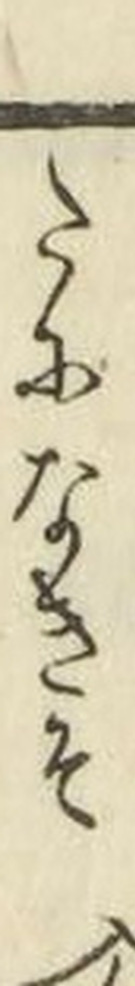たになきそ
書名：江戸名所図会 20巻 巻之12
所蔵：東京学芸大学教育コンテンツアーカイブ
